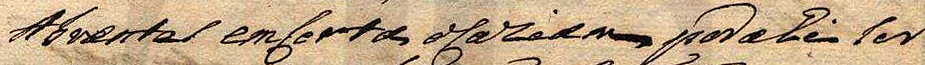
Abrantes em Certa oCaziam por ahi ser
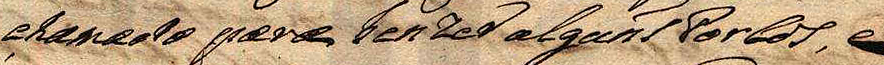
çhamado para benzer alguñs Porcos, e
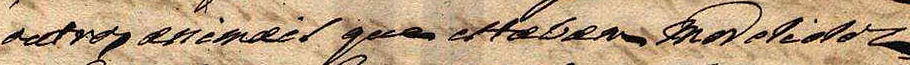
outros animais que estavam mordidoz
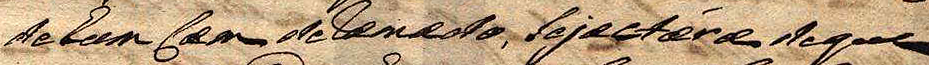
de hum Cam de Ramado, se jactára de que
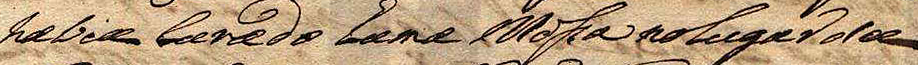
havia curado huma Mossa no Lugar da
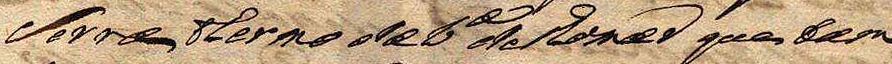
serra o termo da va de Tomar que tam
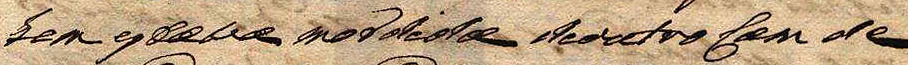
bem estava mordida de outro Cam de
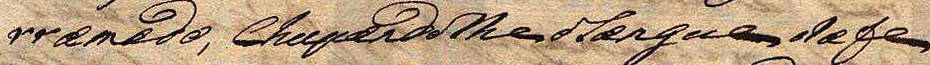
rramado, chupandolhe o sangue da fe
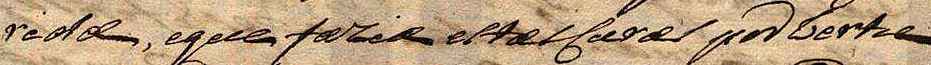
rida, e que fazia estas curas por vertu
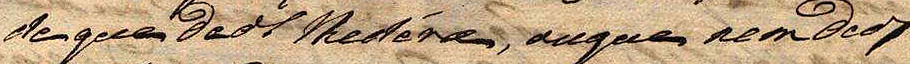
de que deos lhe déra, ou que nem deos
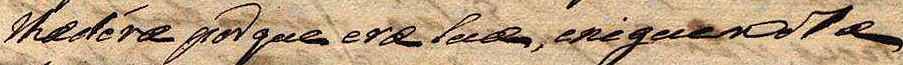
lho déra porque era sua, e niguen o sa
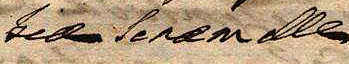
bia se nam elle
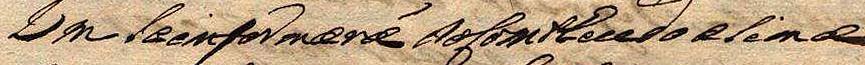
Vm se informará do Comtheudo asima
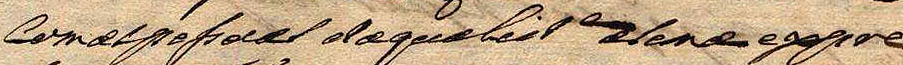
com as pessoas da qualide asema expre
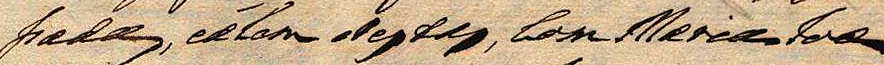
ssadas, e álem destas, com Maria Ioa
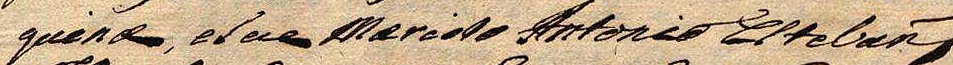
quina, e seu Marido Antonio Estevañs
